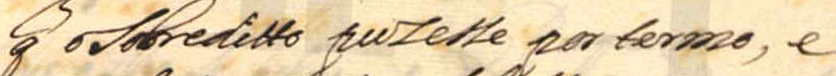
q̅ o sobreditto puzesse por termo, e
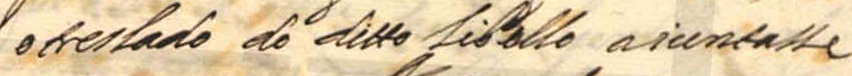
o treslado do ditto libello aiuntasse
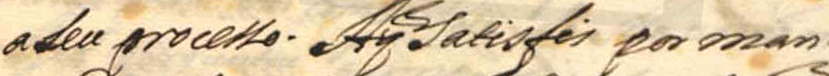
a seu processo. A q̅ satisfis por man
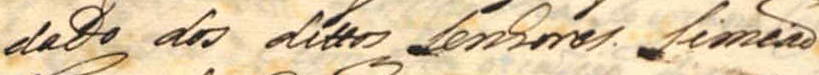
dado dos dittos Senhores Simião
